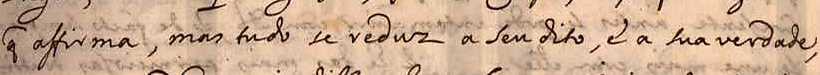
q̄ affirma, mas tudo se reduz a seu dito, e a sua verdade,
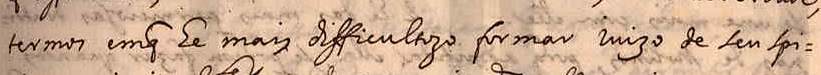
termos em q̄ he mais difficultozo formar iuizo de seu spi
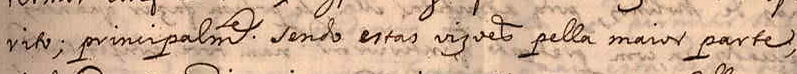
rito, principalmte sendo estas vizoẽs pella maior parte,
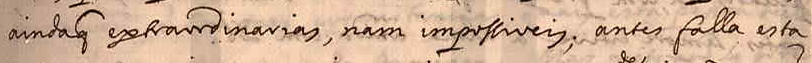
ainda q̄ extraordinarias, nam impossiveis, antes falla esta
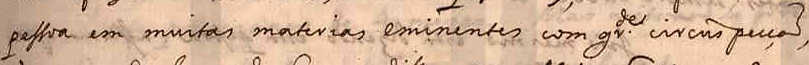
pessoa em muitas materias eminentes com gr.de circūspecçaõ,
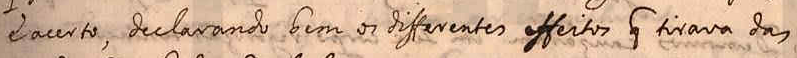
e acerto, declarando bem os differentes effeitos q̄ tirava das
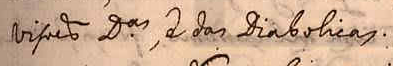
visoẽs D.as, e das Diabolicas.
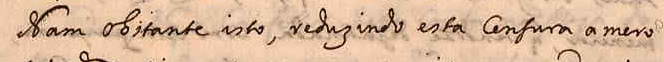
Nam obstante isto, reduzindo esta Censura a mero
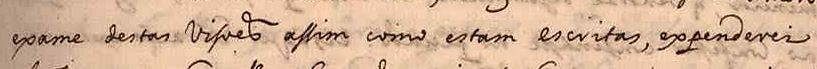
exame destas Visoẽs assim como estam escritas, expenderei
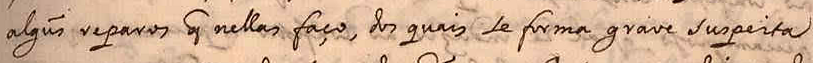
algūs reparos q̄ nellas faço, dos quais se forma grave suspeita
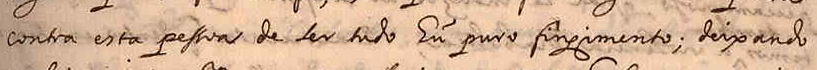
contra esta pessoa de ser tudo hū puro fingimento; deixando
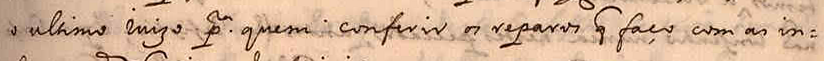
o ultimo iuizo p.ra quem conferir os reparos q̄ faço com as in
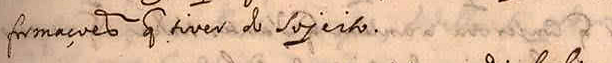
formaçoẽs q̄ tiver do sojeito.
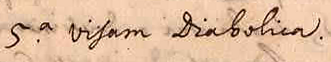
5.a visam Diabolica.
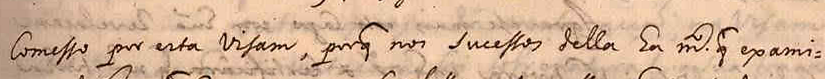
Comesso por esta visam, porq̄ nos sucessos della ha mto q̄ exami
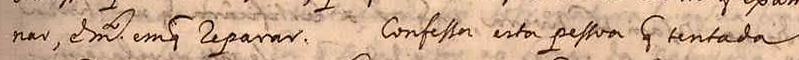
nar, e m.to em q̄ Reparar. Confessa esta pessoa q̄ tentada
